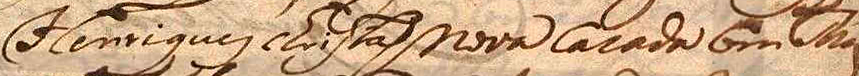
Henriques christã nova Cazada Com Ma
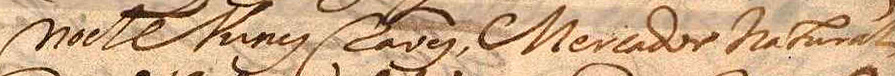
noel Nunes Chaves, Mercador natural
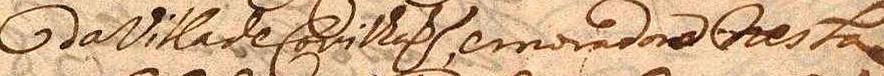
da Villa de Covilhã, e moradora nesta
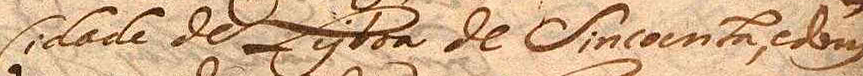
Cidade de Lisboa de Sincoenta, e dous
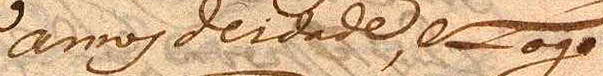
annos de idade, e Logo
